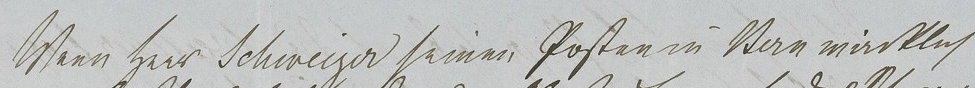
Wenn Herr Schweizer seinen Posten in Bern wircklich
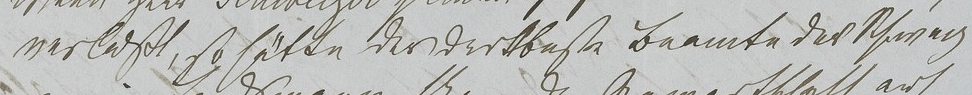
verläßt, so hätte der drittbeste Beamte der Schweiz
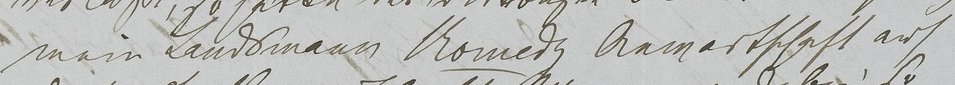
mein Landsmann Romedy Anwartschaft auf
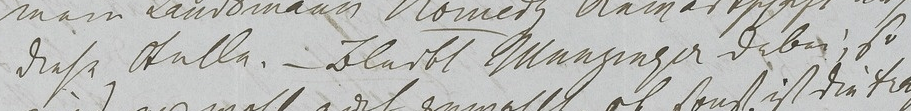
diese Stelle. – Bleibt Munzinger dabei, so
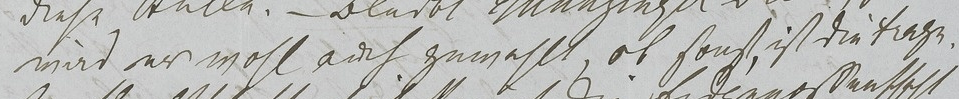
wird er wohl auch gewählt, ob sonst, ist die Frage.
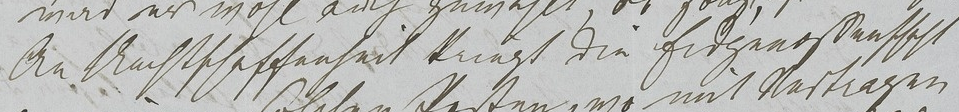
An Rechtschaffenheit kriegt die Eidgenoßenschaft
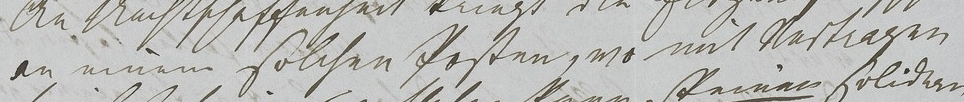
an einem solchen Posten, wo mit Verträgen
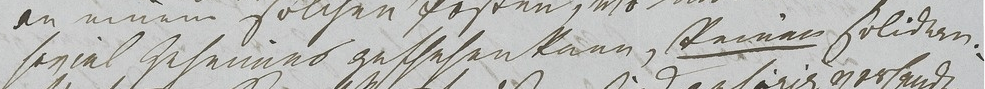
soviel Geheimes geschehen kann, keinen solidern. –
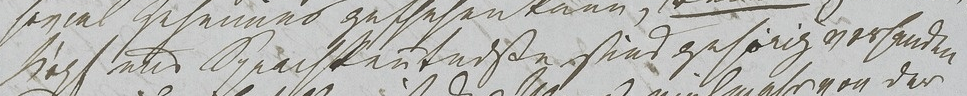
Kopf und Sprachkenntniße sind gehörig vorhanden
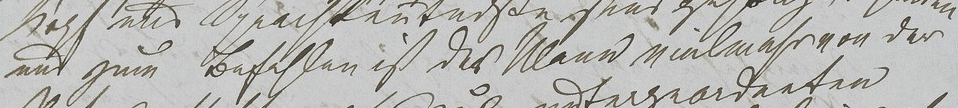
und zum Befehlen ist der Mann vielmehr von der
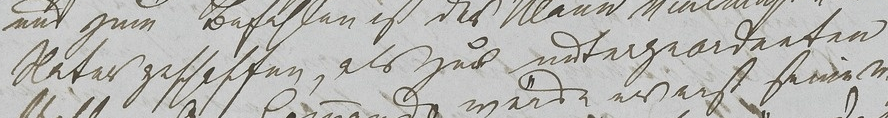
Natur geschaffen, als zur untergeordneten
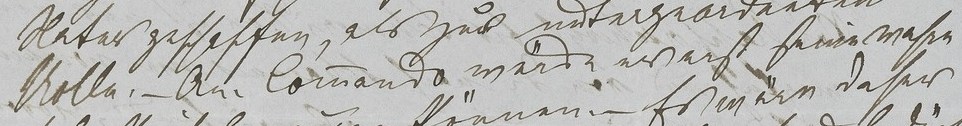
Rolle. – Am Commando würde er erst seine wahre
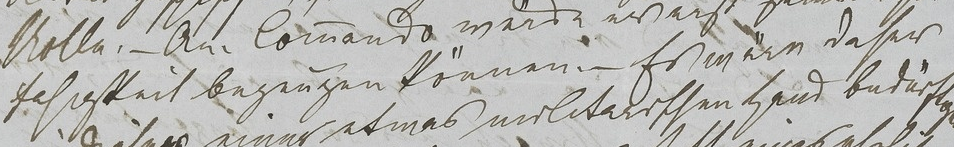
Fähigkeit bezeugen können. – Es wäre daher in
